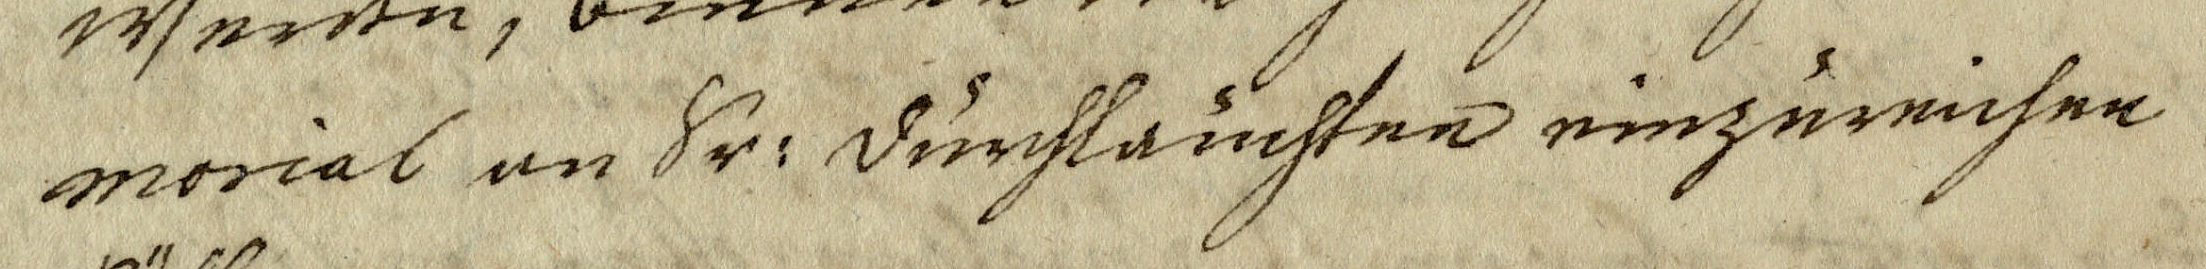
morial an Sr Durchlauchten einzureichen
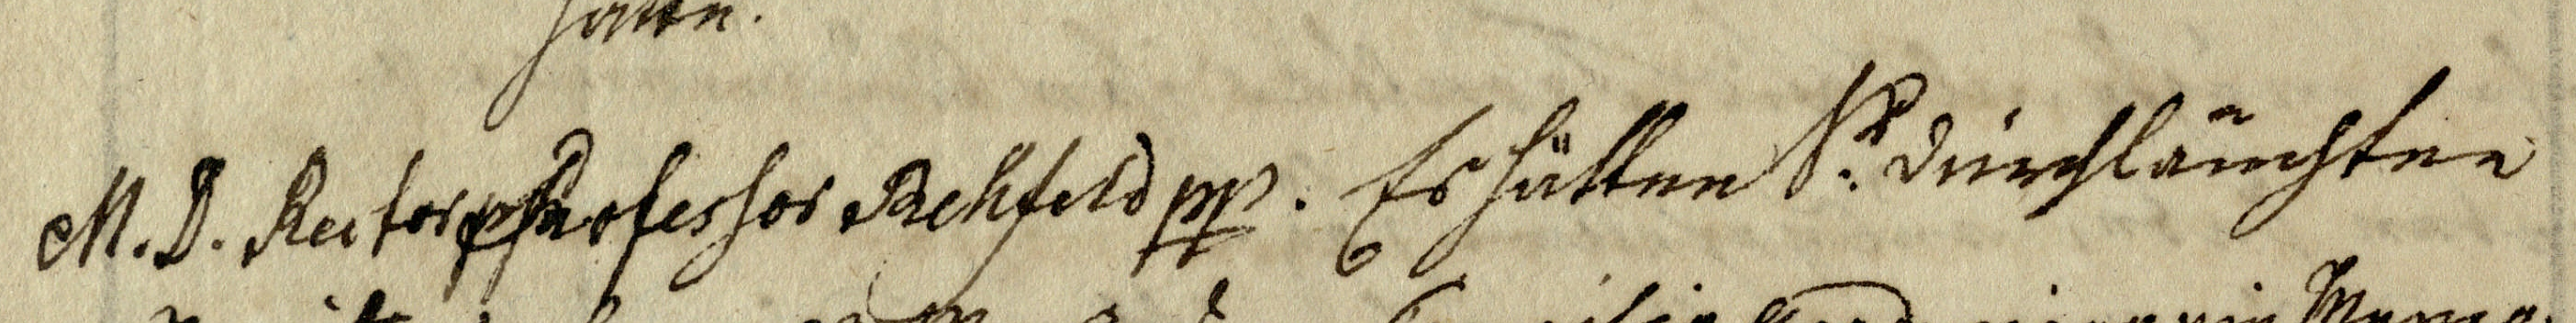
M. D. Rector Professor Rehfeld pp. Es hätten Sr Durchlauchten
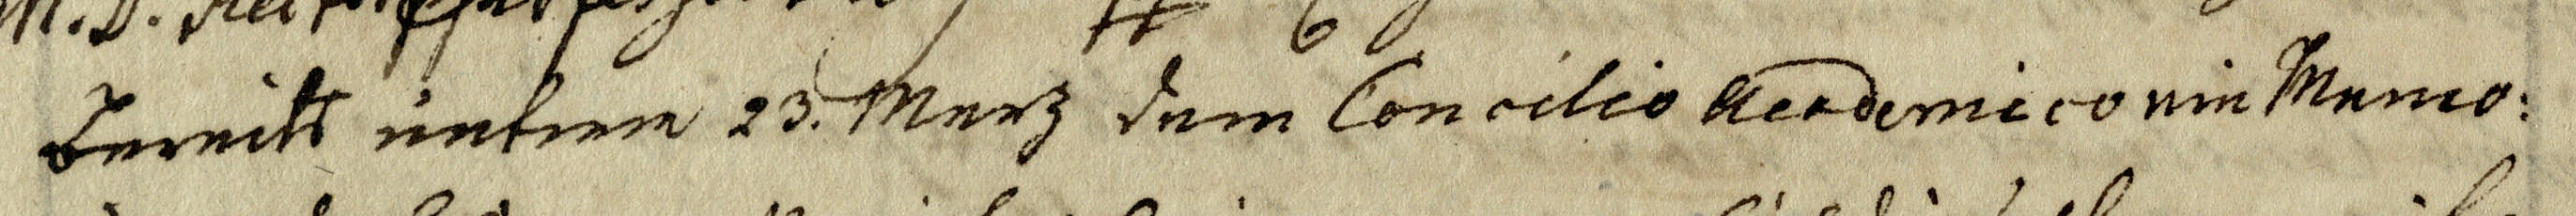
bereits unterm 23. Merz dem Concilio Academico ein Memo¬
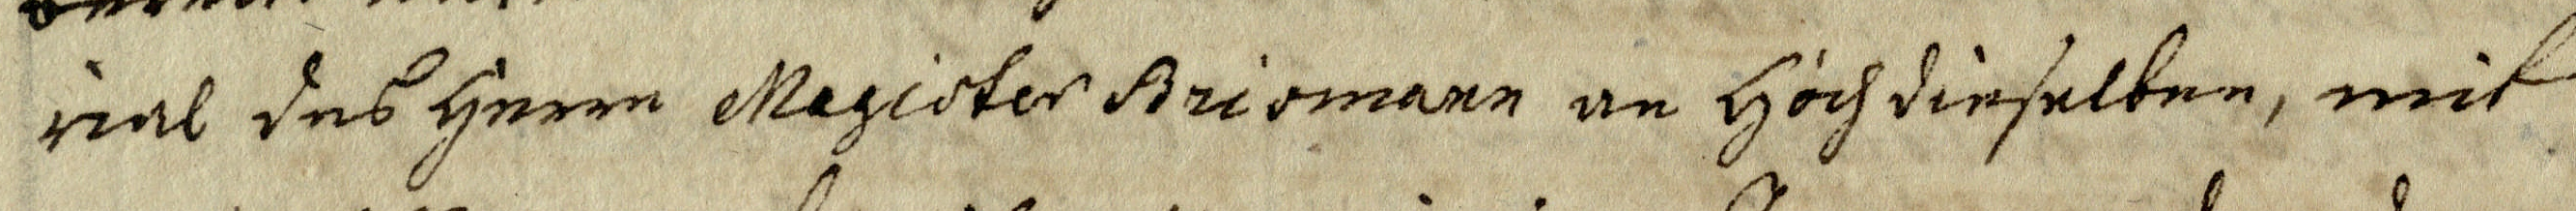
rial des Herrn Magister Brismann an Hochdieselben, mit
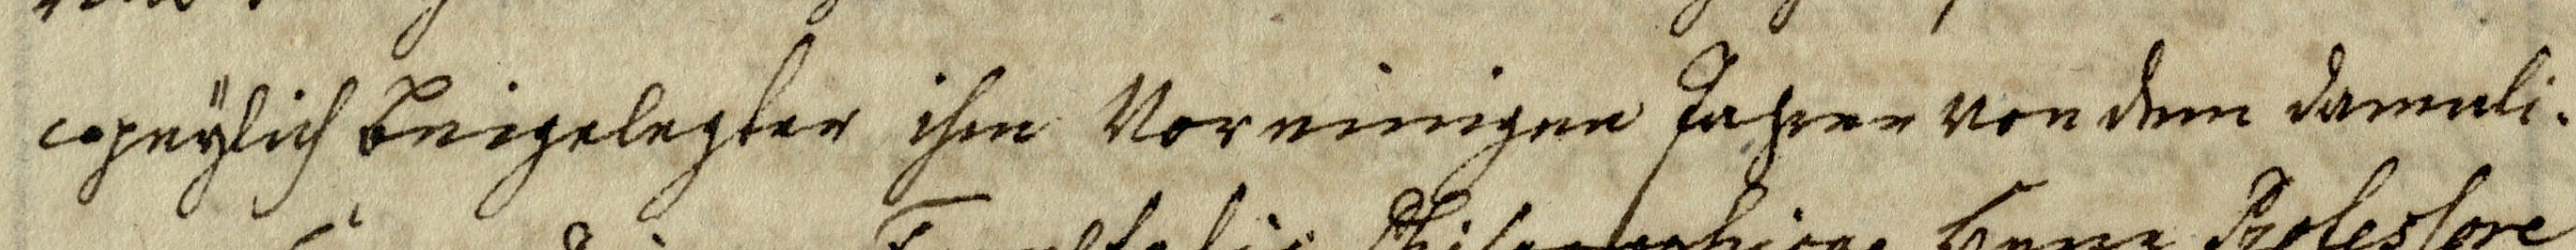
copeÿlich beigelegter ihm vor einigen Jahren von dem damali¬
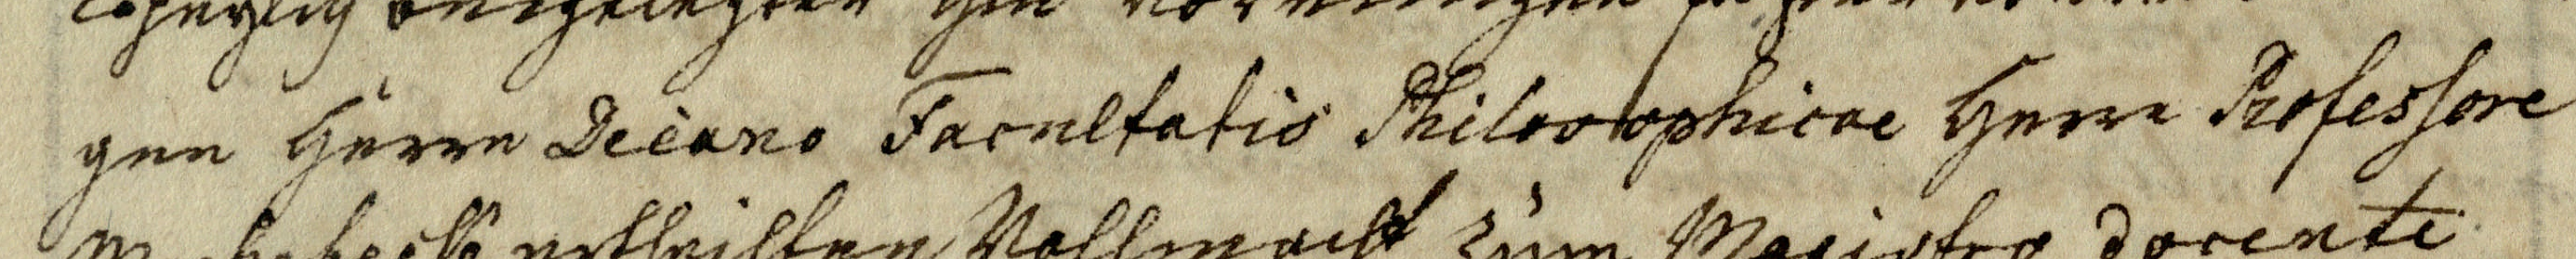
gen Herrn Decano Facultatis Philosophicae Herrn Professore
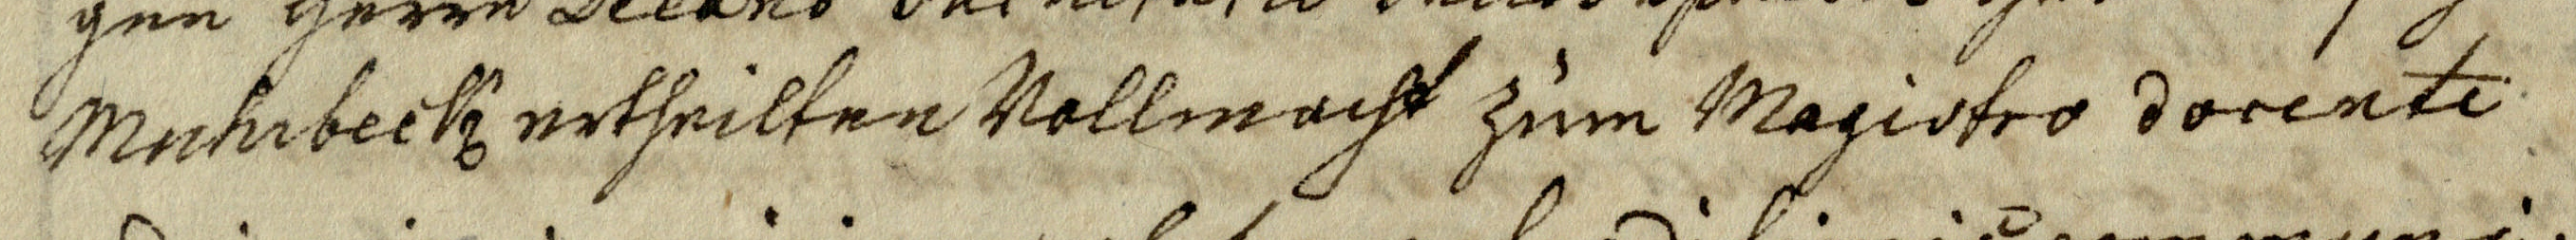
Muhrbeck ertheilten Vollmacht zum Magister docenti
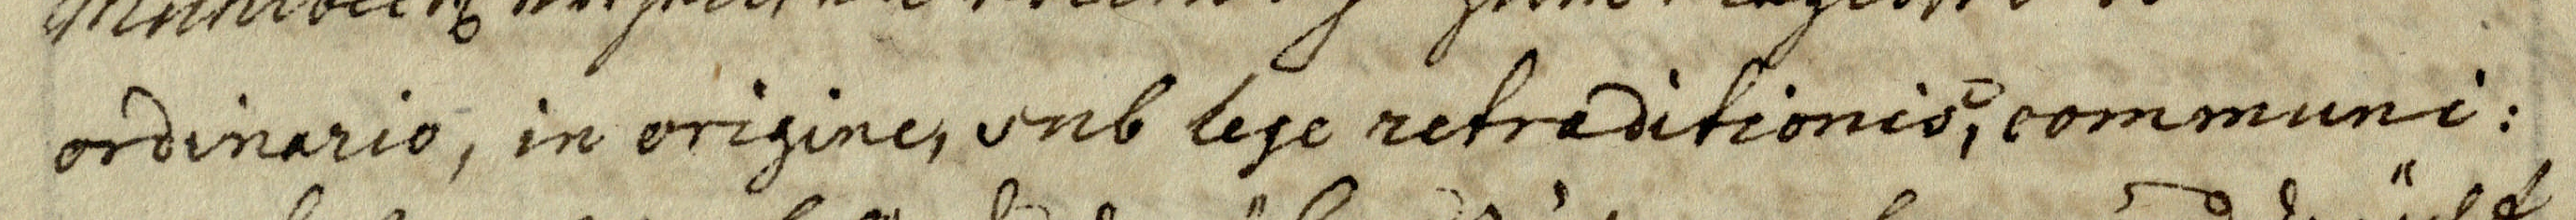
ordinario, in origine, sub lege retraditionis, communi¬
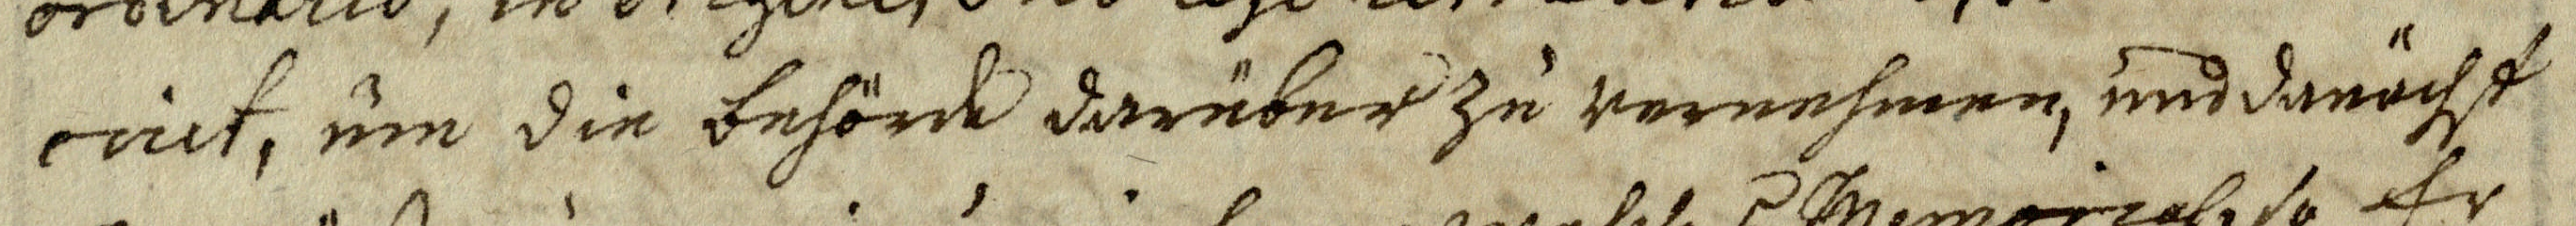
ciret, um die Behörde darüber zu vernehmen und danächst
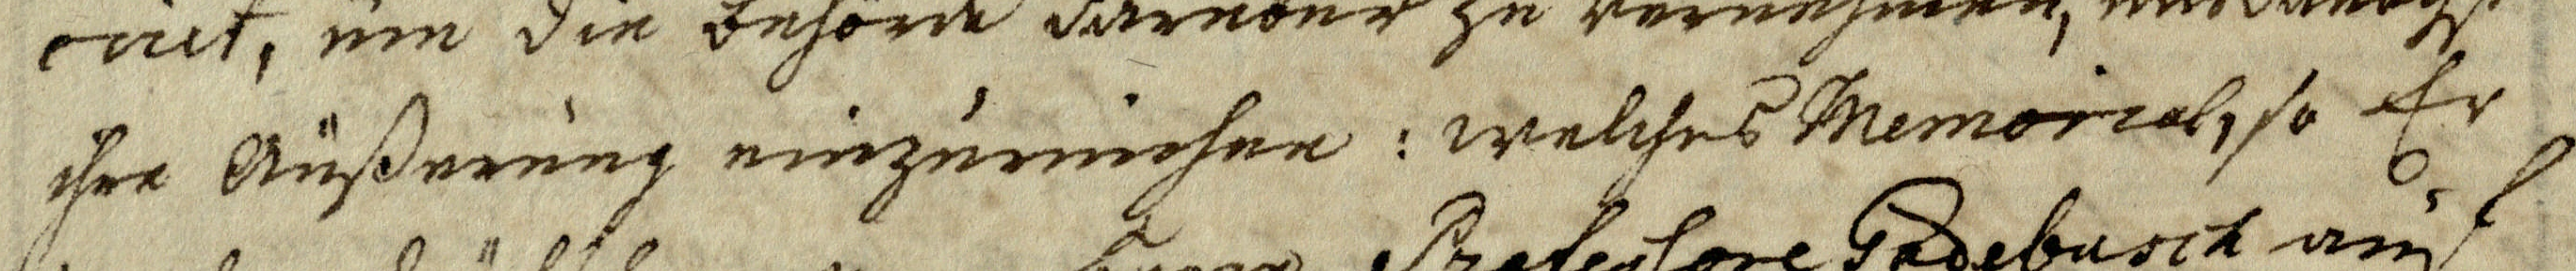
ihre Äußerung einzureichen: welches Memorial, so Er
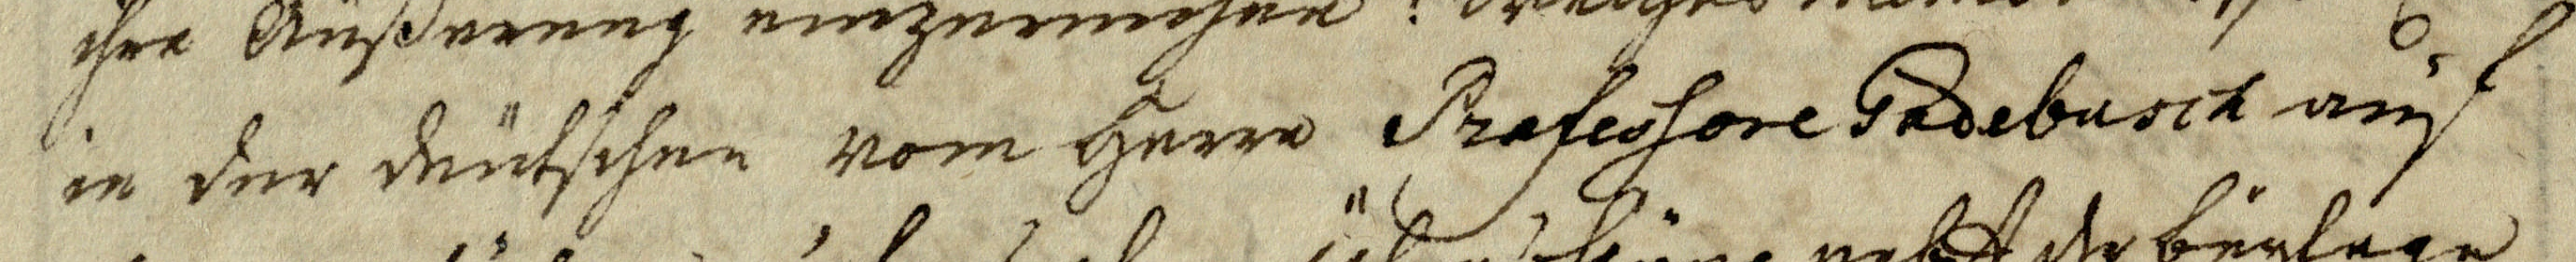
in der deutschen vom Herrn Professore Gadebusch auf
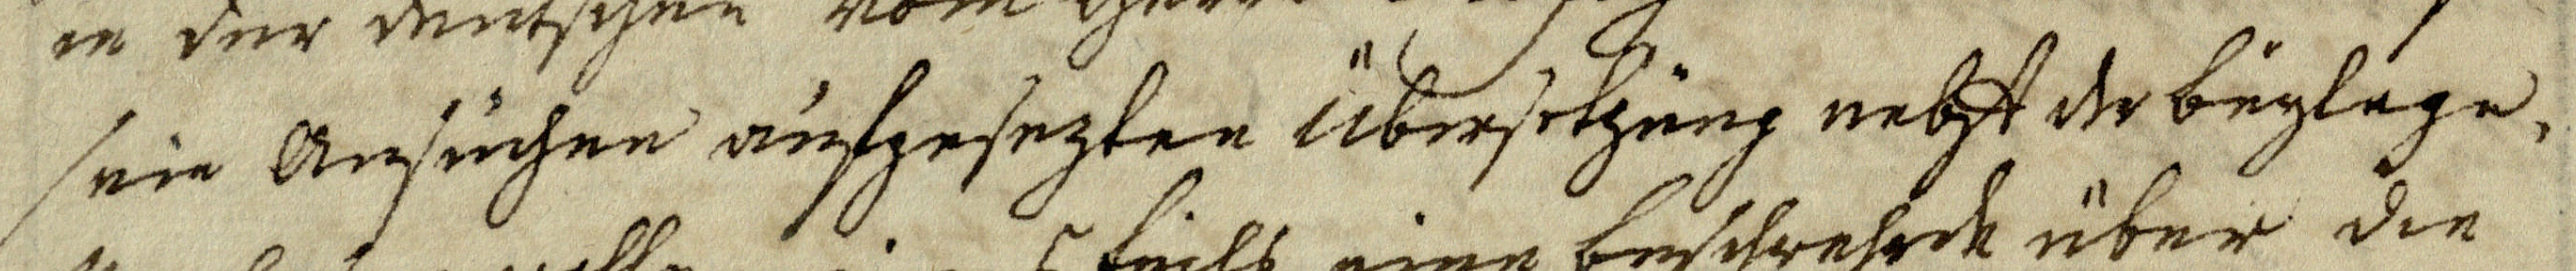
sein Ansuchen aufgesezten Übersetzung nebst der Beÿlage,
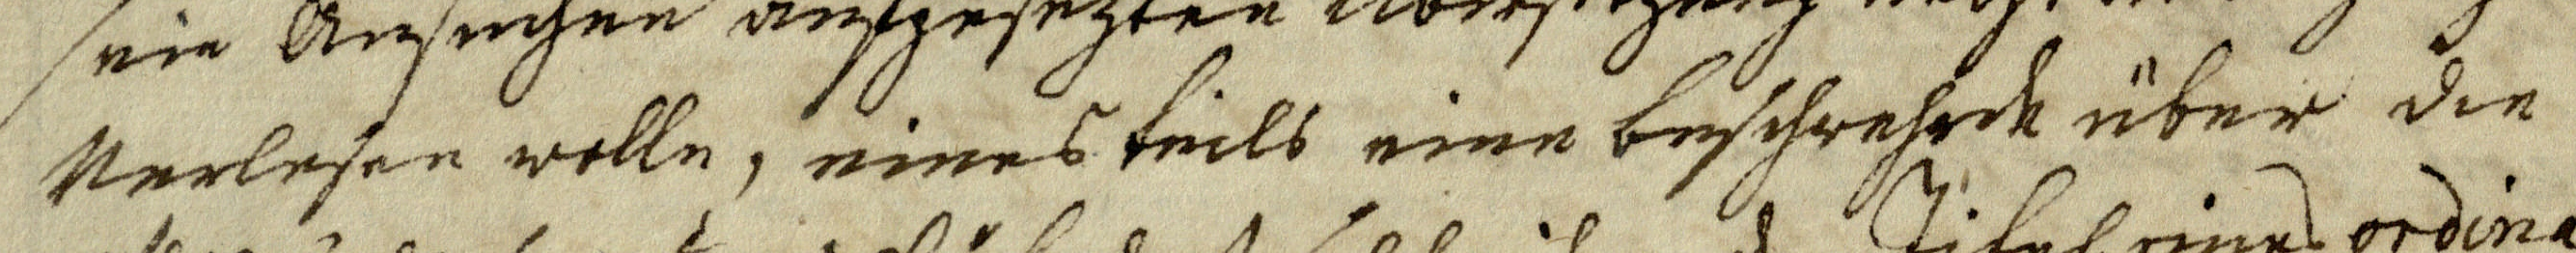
verlesen wolle, eines teils eine Beschwehrde über die
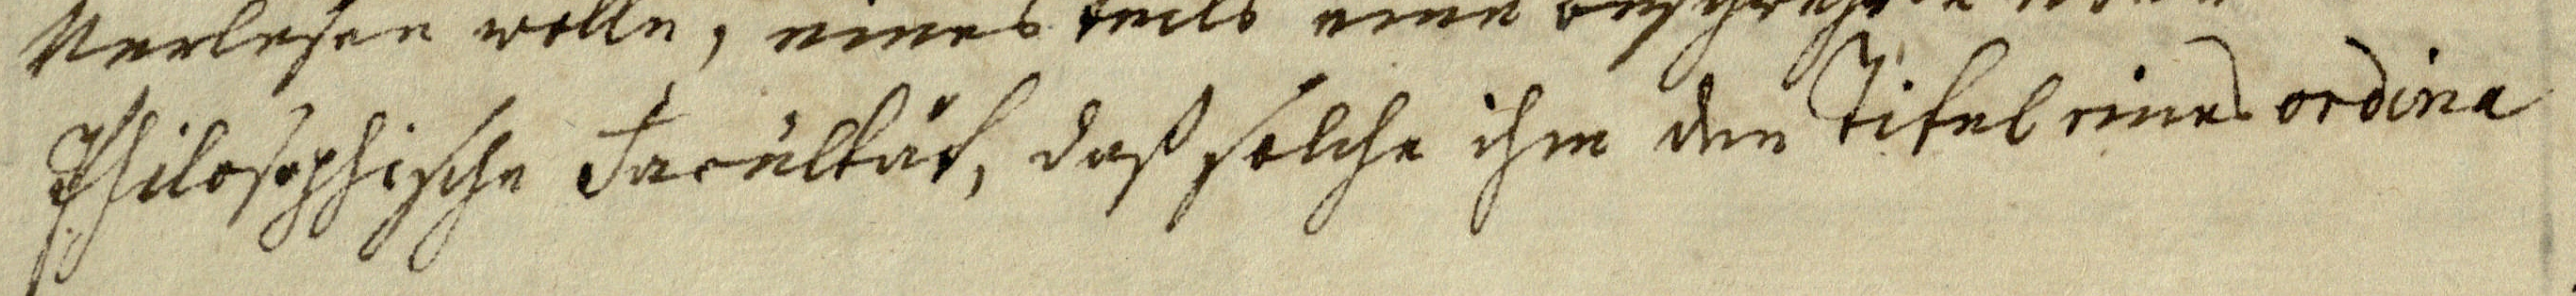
Philosophische Facultät, daß solche ihm den Titel eines ordina
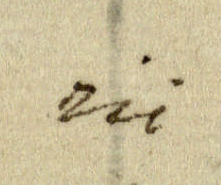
rii
